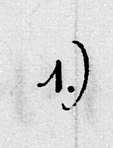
1.)
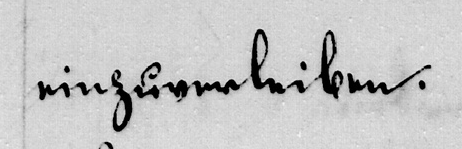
einzuverleiben.
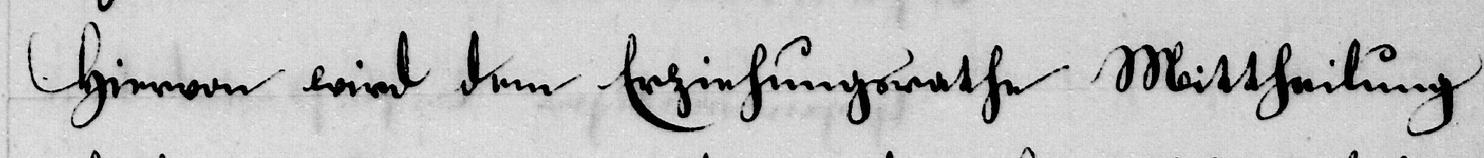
Hiervon wird dem Erziehungsrathe Mittheilung
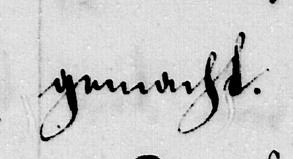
gemacht.
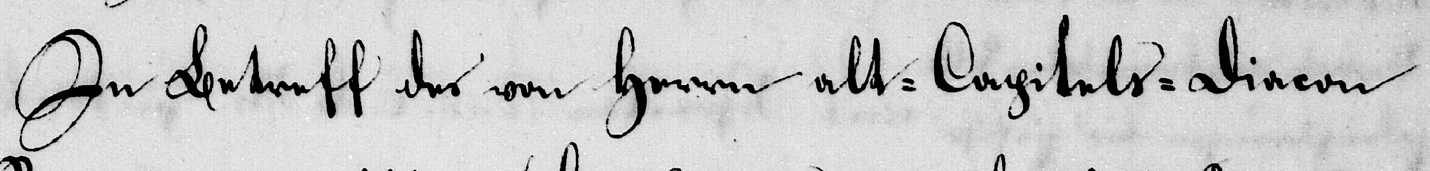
In Betreff des von Herrn alt-Capitels-Diacon
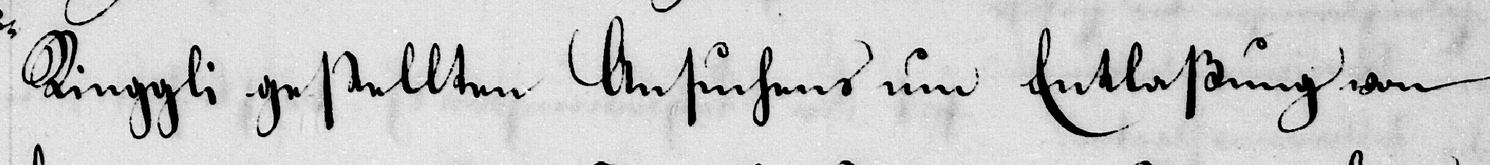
Ringgli gestellten Ansuchens um Entlaßung von
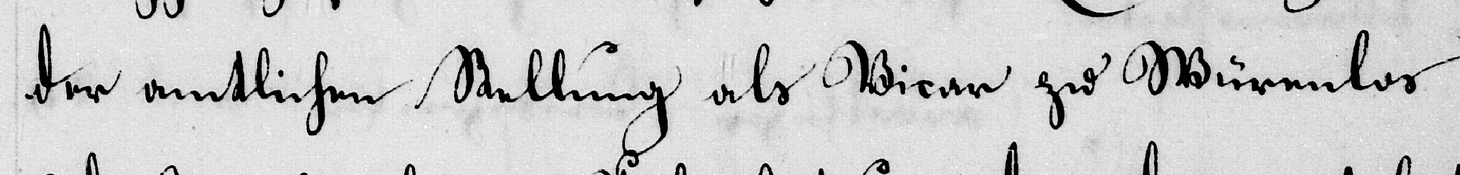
der amtlichen Stellung als Vicar zu Würenlos
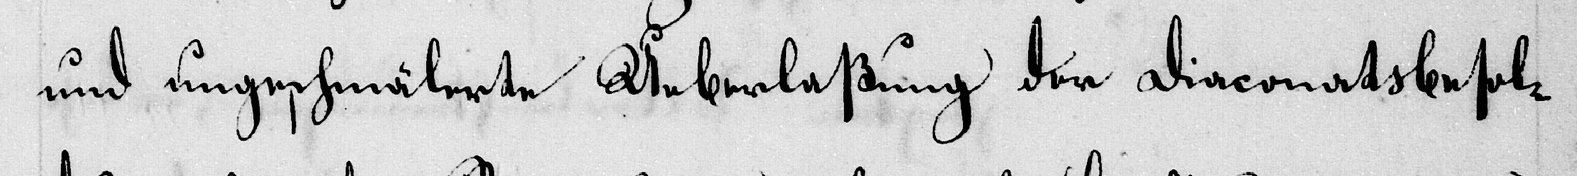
und ungeschmälerte Ueberlaßung der Diaconatsbesol¬
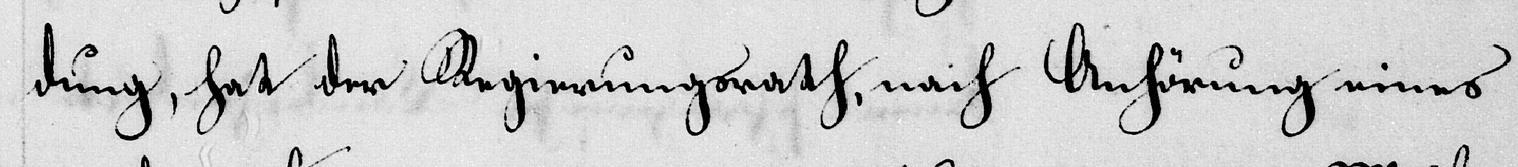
dung, hat der Regierungsrath, nach Anhörung eines
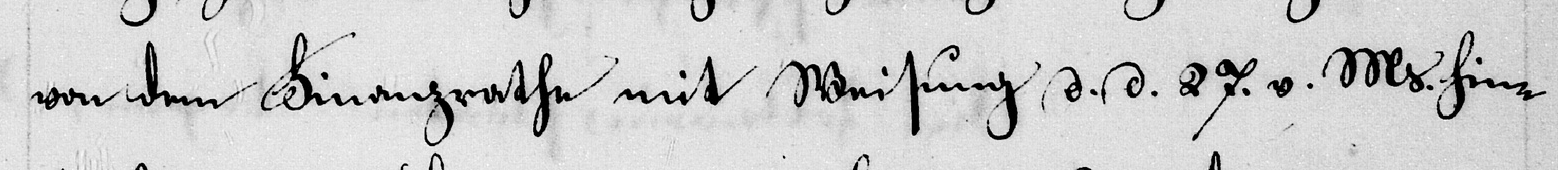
von dem Finanzrathe mit Weisung d. d. 27. v. Ms. hin¬
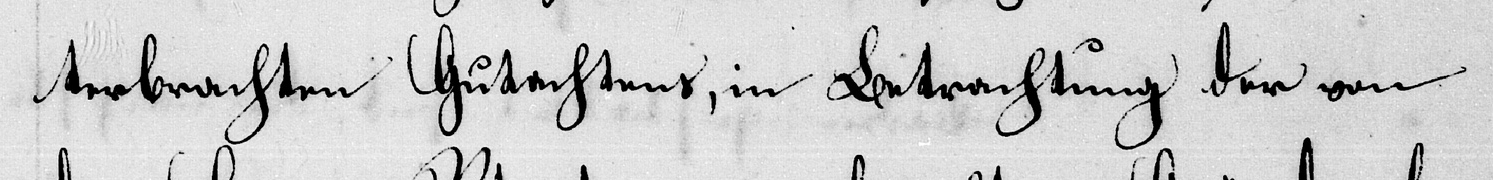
terbrachten Gutachtens, in Betrachtung der von
